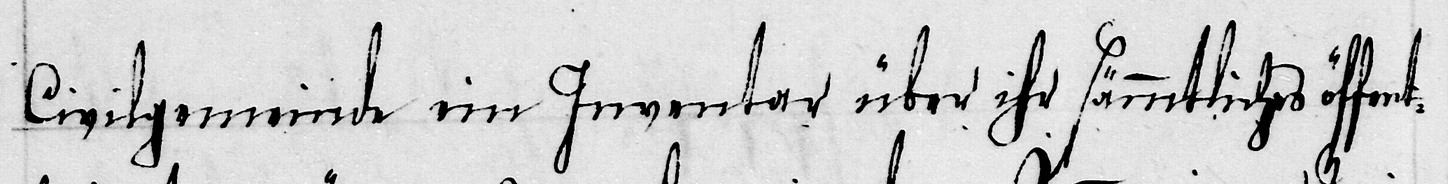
Civilgemeinde ein Inventar über ihr sämmtliches öf¬
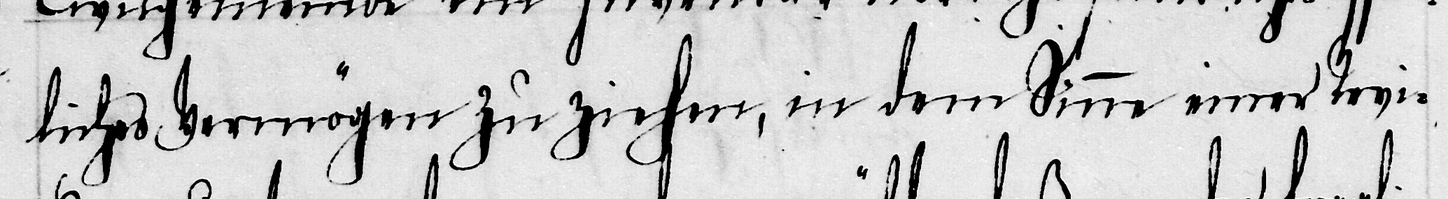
liches Vermögen zu ziehen, in dem Sinne einer Revi¬
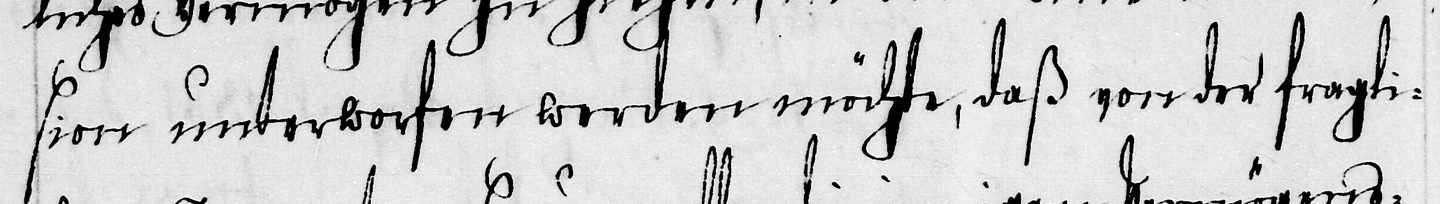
sion unterworfen werden möchte, daß von der fragli¬
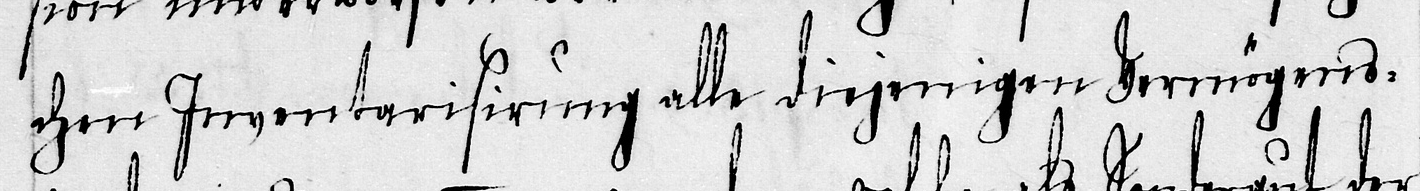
chen Inventarisirung alle diejenigen Vermögens¬
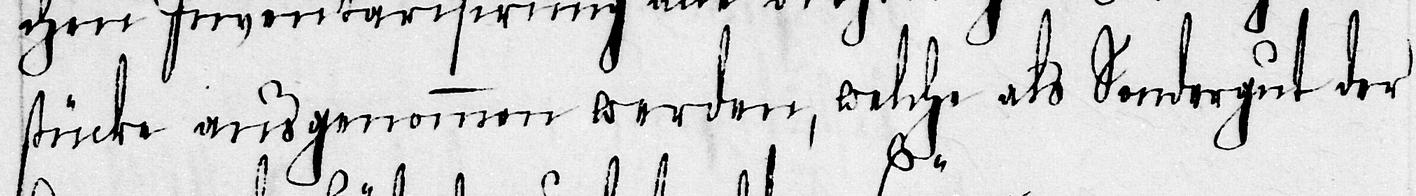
stücke ausgenommen werden, welche als Sondergut der
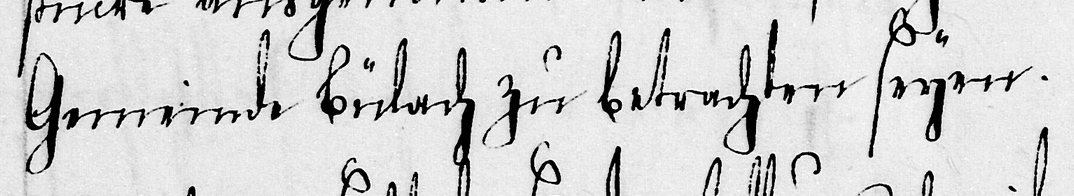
Gemeinde Bülach zu betrachten seyen.
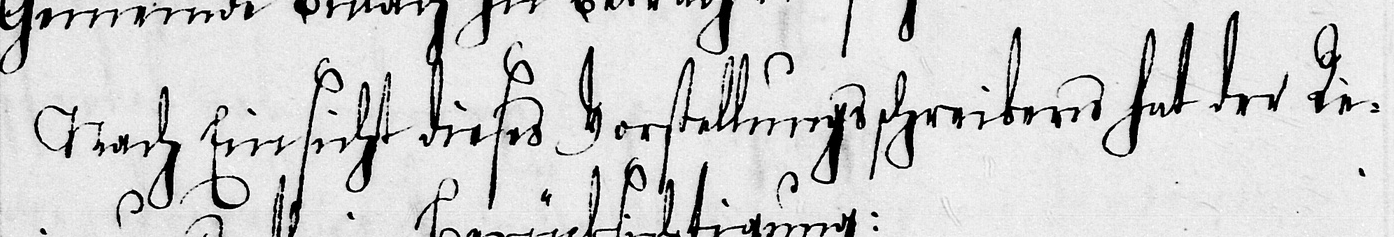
Nach Einsicht dieses Vorstellungsschreibens hat d¬
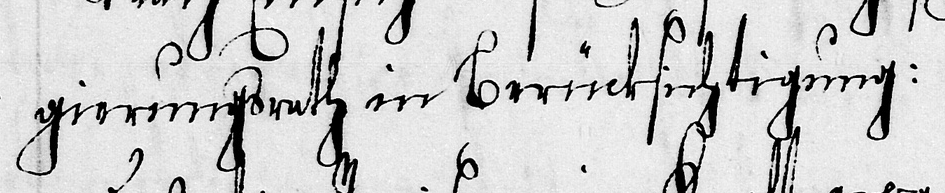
egierungsrath in Berücksichtigung:
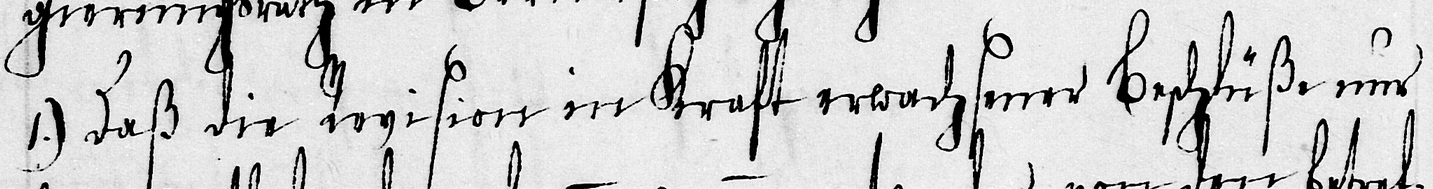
1.) Daß die Revision in Kraft erwachsener Beschlüße nur
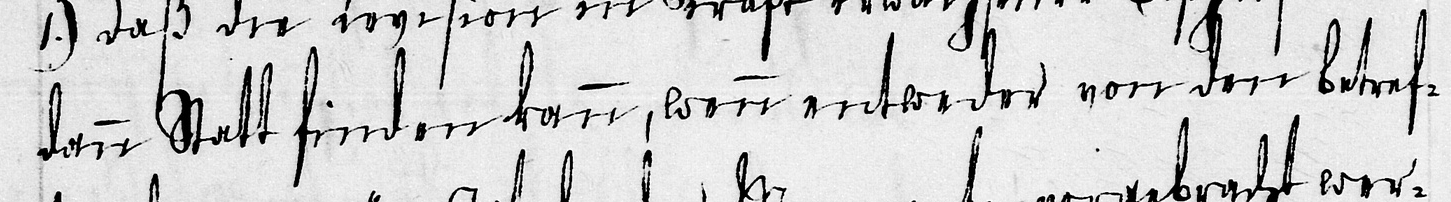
dann Statt finden kann, wenn entweder von den betref¬
